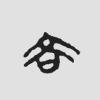吝
